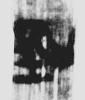坐
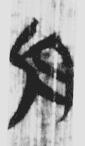於
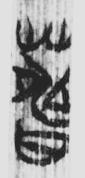薵（疇）
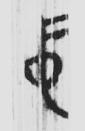𠁩
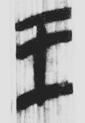王
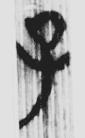子
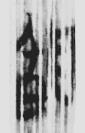䎽（問）
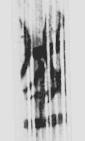城（成）
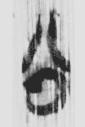公
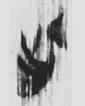此
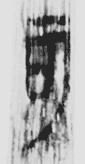可（何）
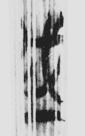城（成）
